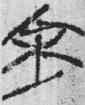○（豫）
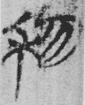利
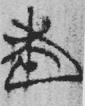建
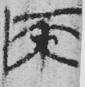侯（侯）
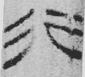行
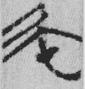帀（師）
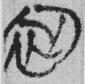初
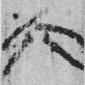六
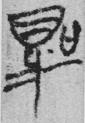鳴
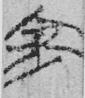○（豫）
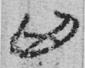凶
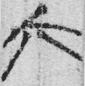六
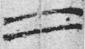二
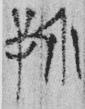○（介）
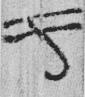于
